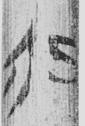亦
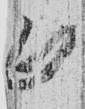㠯（以）
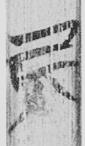○（己）
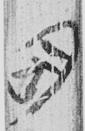名
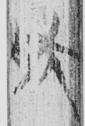肰（然）
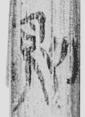則
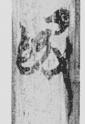臤（賢）
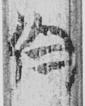於
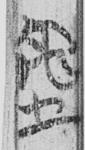○（禹）
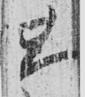也
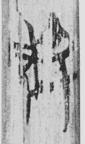與舜
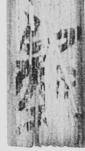○（舜）
